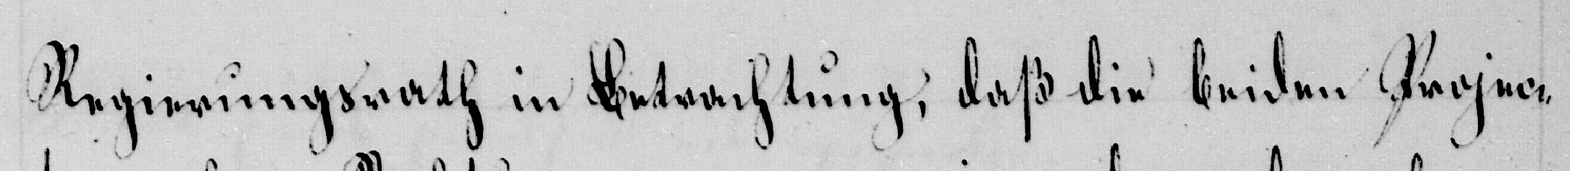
Regierungsrath in Betrachtung, daß die beiden Projec¬
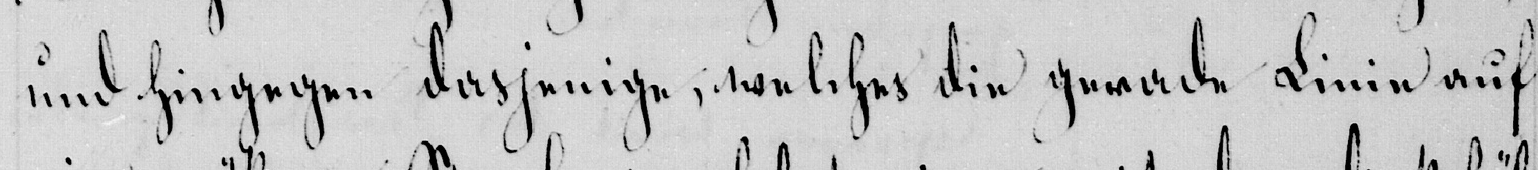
und hingegen dasjenige, welches die gerade Linie auf
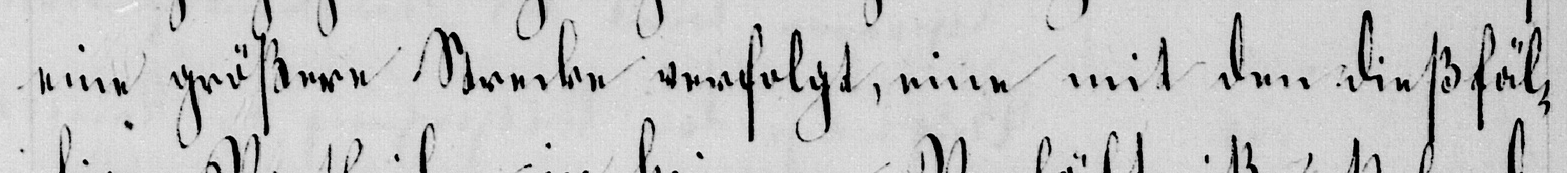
eine größere Strecke verfolgt, eine mit den dießfäl¬
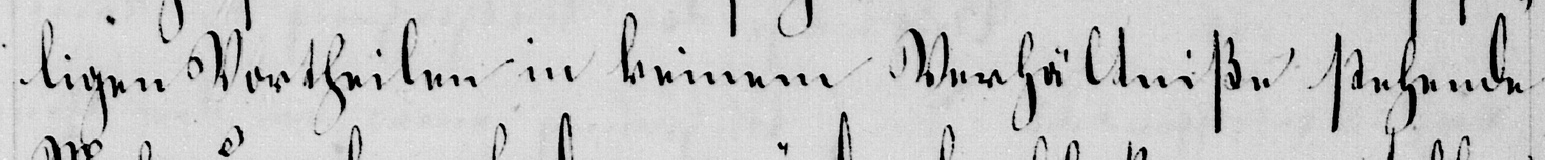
ligen Vortheilen in keinem Verhältniße stehende
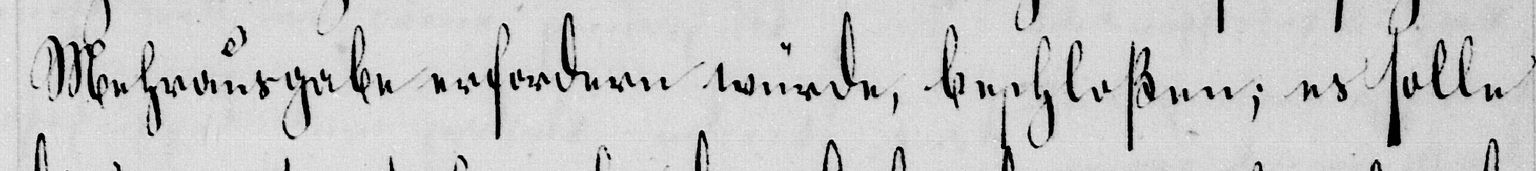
Mehrausgabe erfordern würde, beschloßen; es solle
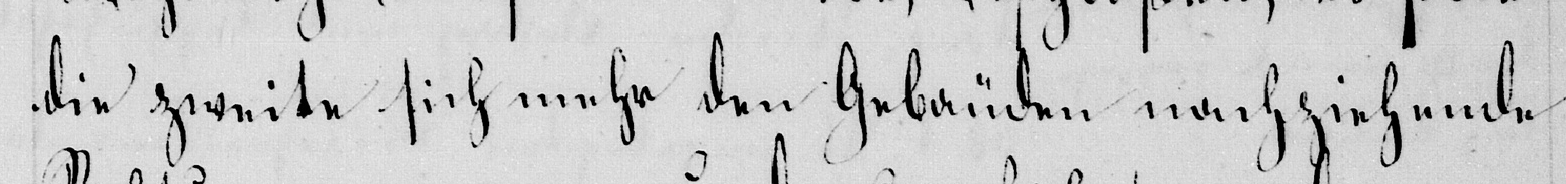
die zweite sich mehr den Gebäuden nachziehende
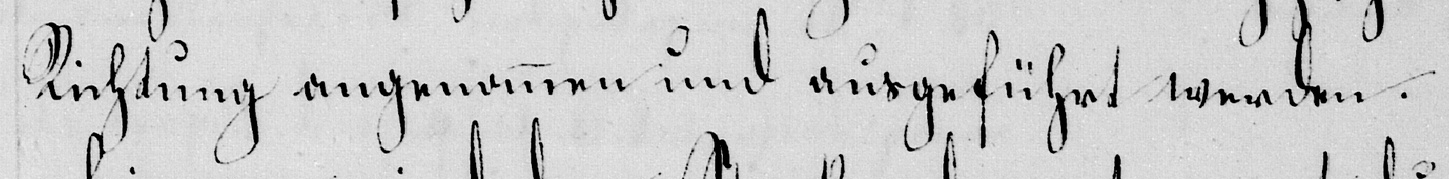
Richtung angenommen und ausgeführt werden.
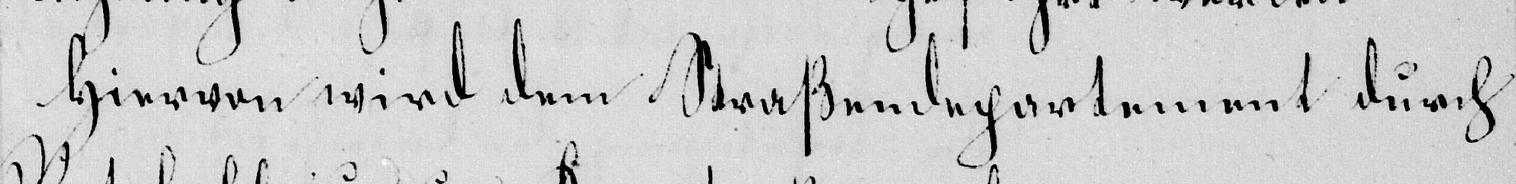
Hiervon wird dem Straßendepartement durch
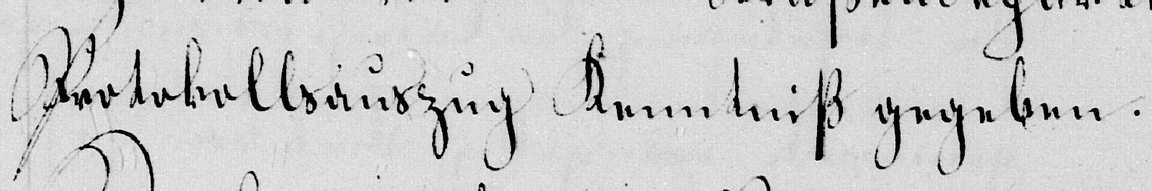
Protokollsauszug Kenntniß gegeben.
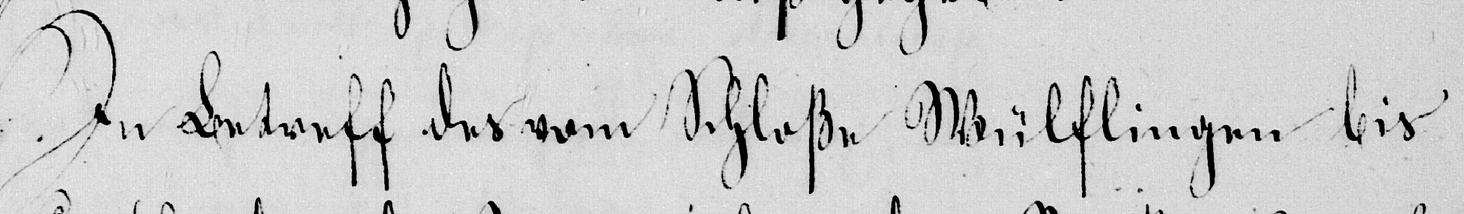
In Betreff des vom Schloße Wülflingen bis
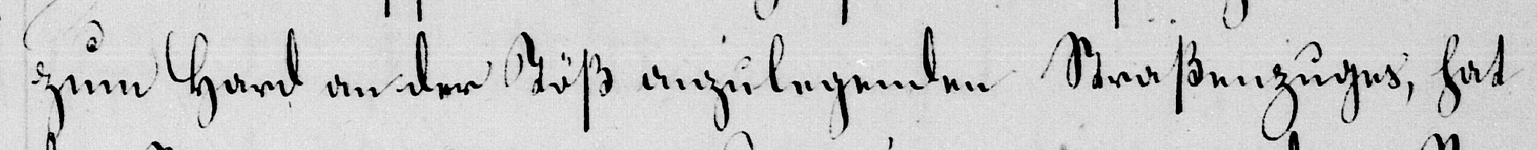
zum Hard an der Töß anzulegende Straßenzuges, hat
